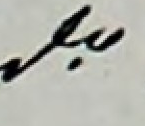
do
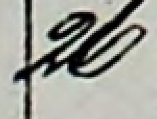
26
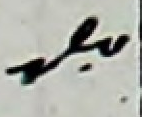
do
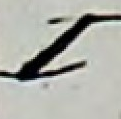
I
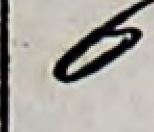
6
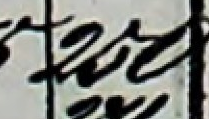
250
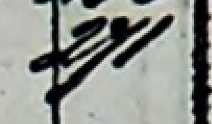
271
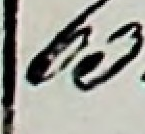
63
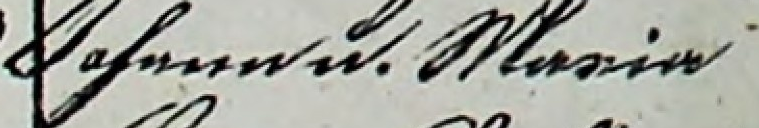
Johann u. Maria
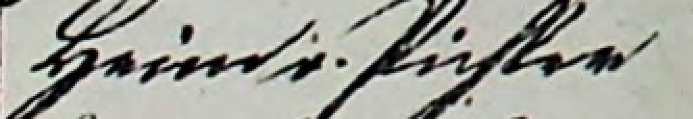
Heim v. Pichler
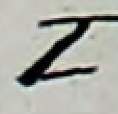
I
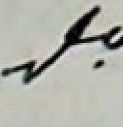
do
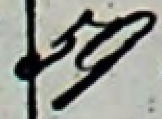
59
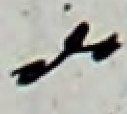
do
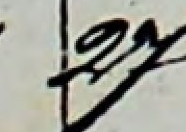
27
